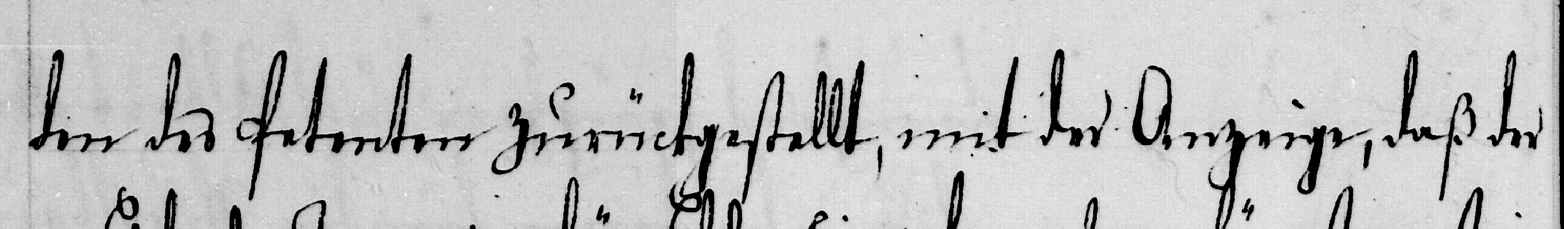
den des Petenten zurückgestellt, mit der Anzeige, daß der
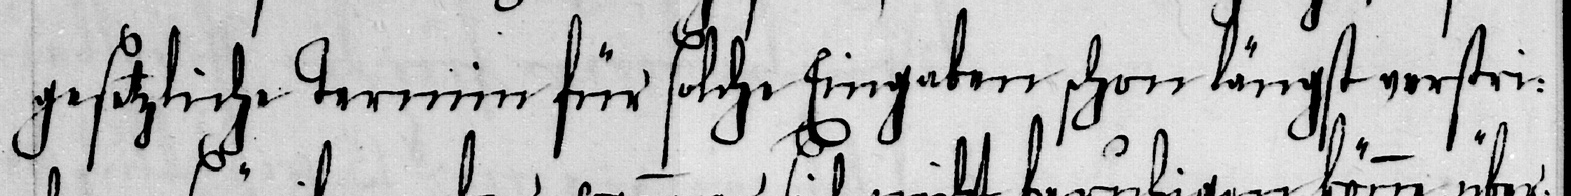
gesetzliche Termin für solche Eingaben schon längst verstr¬
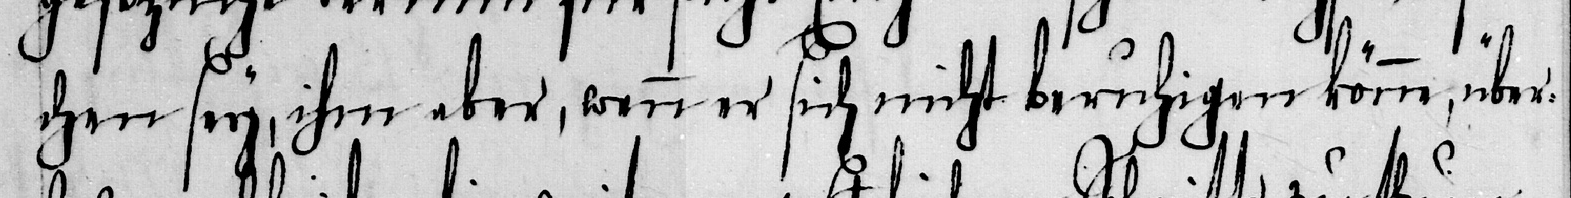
ichen sey, ihm aber, wenn er sich nicht beruhigen könne, über¬
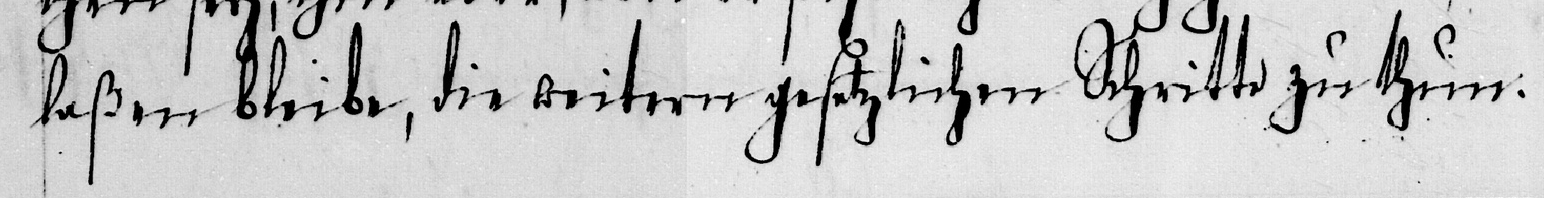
laßen bliebe, die weitern gesetzlichen Schritte zu thun.
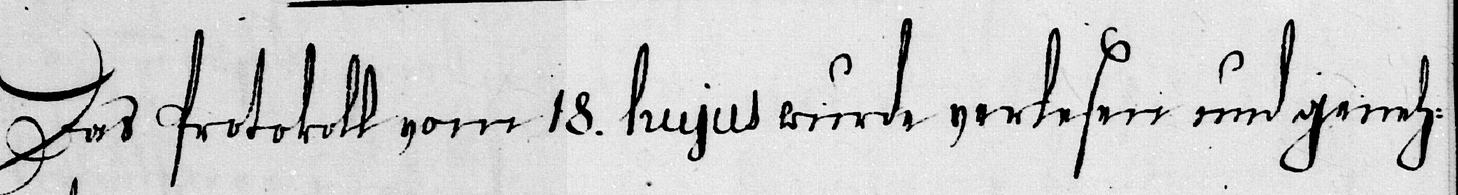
Das Protokoll vom 18. hujus wurde verlesen und geneh¬
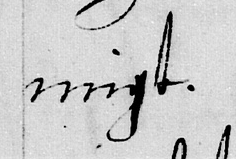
migt.
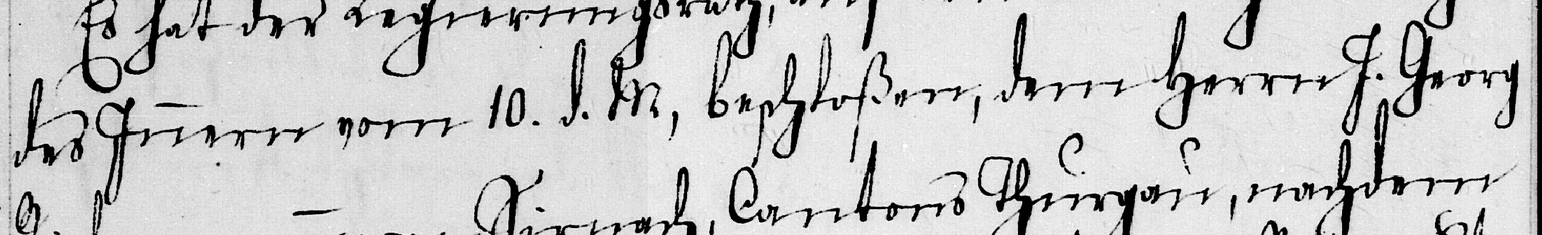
des Innern vom 10. d. M., beschloßen, dem Herrn J. Georg
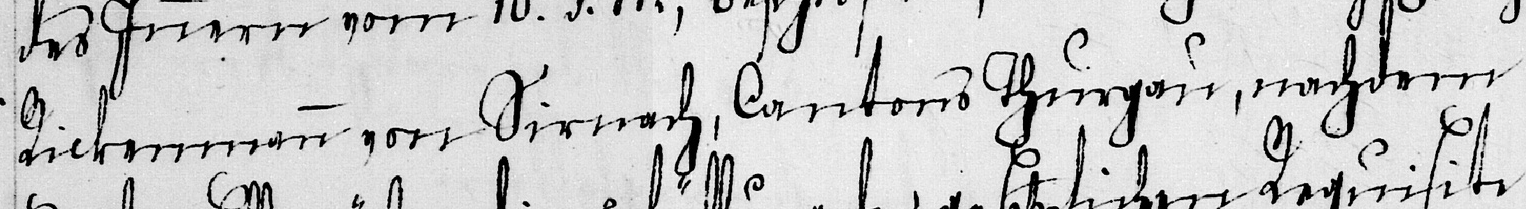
Rickenmann von Sirnach, Cantons Thurgau, nachdem
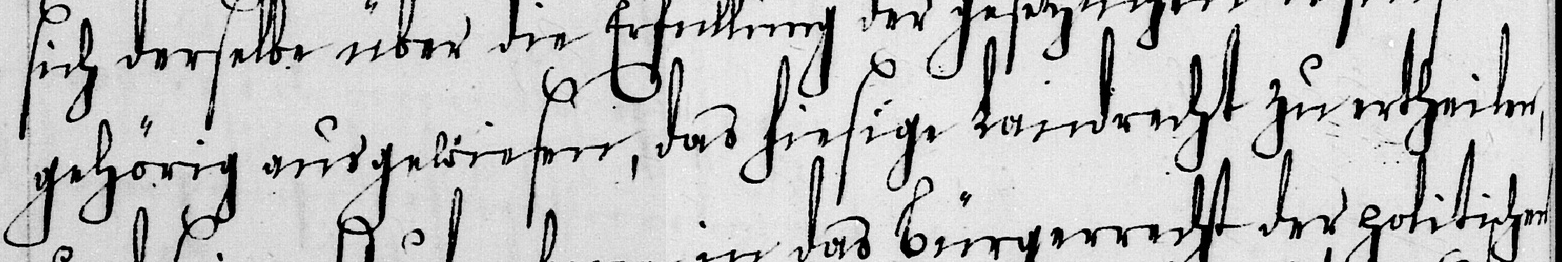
gehörig ausgewiesen, das hiesige Landrecht zu ertheilen,
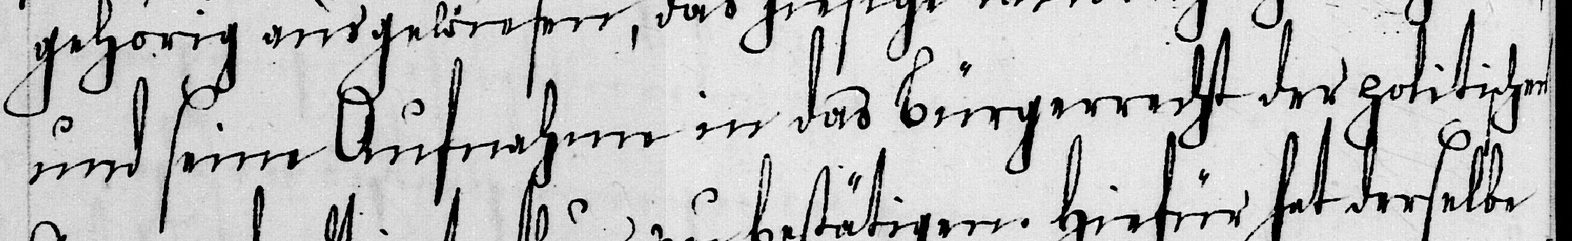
und seine Aufnahme in das Bürgerrecht der politisch¬
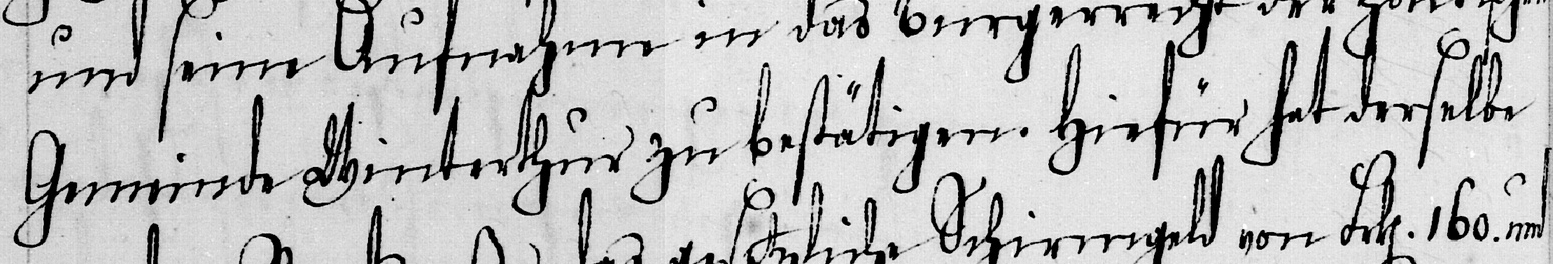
Gemeinde Winterthur zu bestätigen. Hiefür hat derselbe
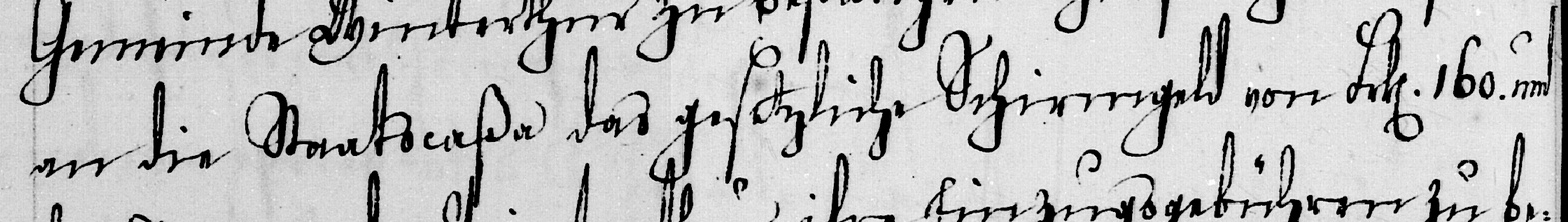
an die Staatscaße das gesetzliche Schirmgeld von Frk[en]. 160.
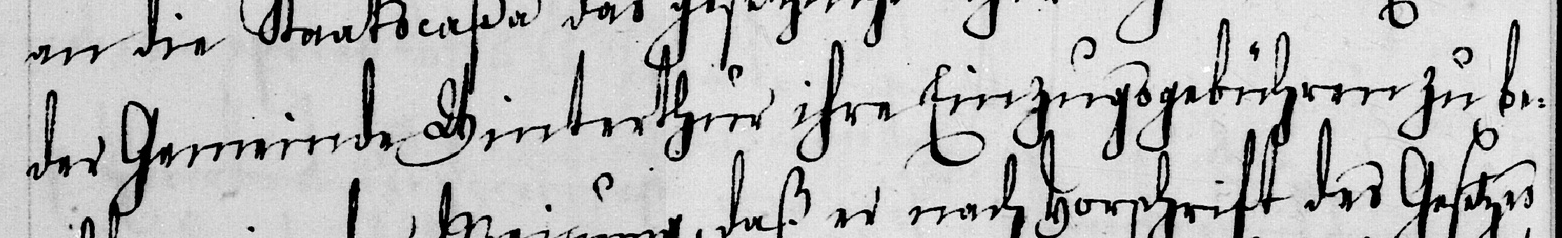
der Gemeinde Winterthur ihre Einzugsgebühren zu be¬
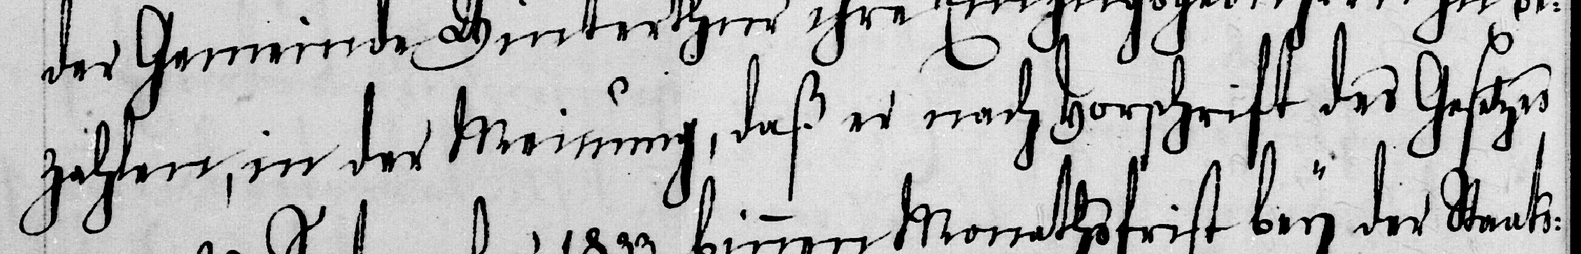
zahlen, in der Meinung, daß er nach Vorschrift des Gesetz¬
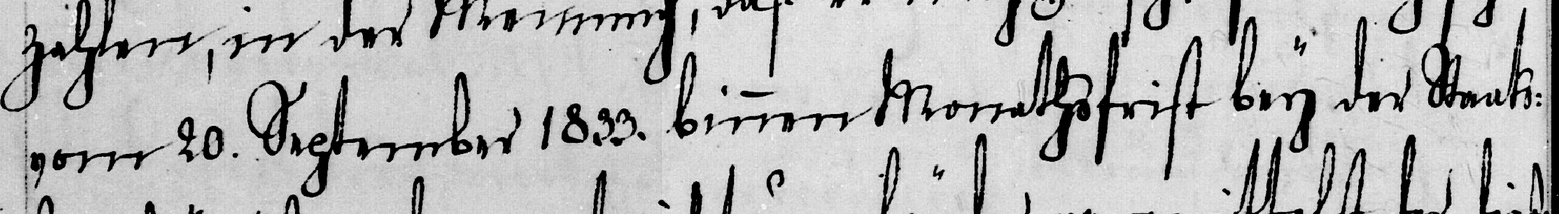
vom 20. Deptember 1833. binnen Monathsfrist bey der Staats¬
